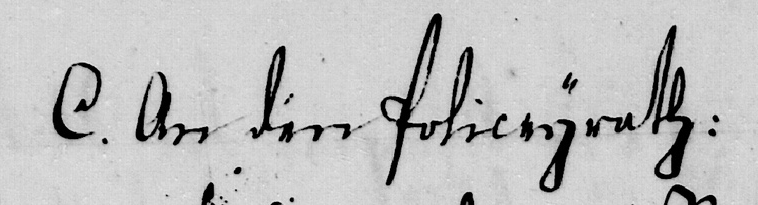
C.) An den Policeyrath:
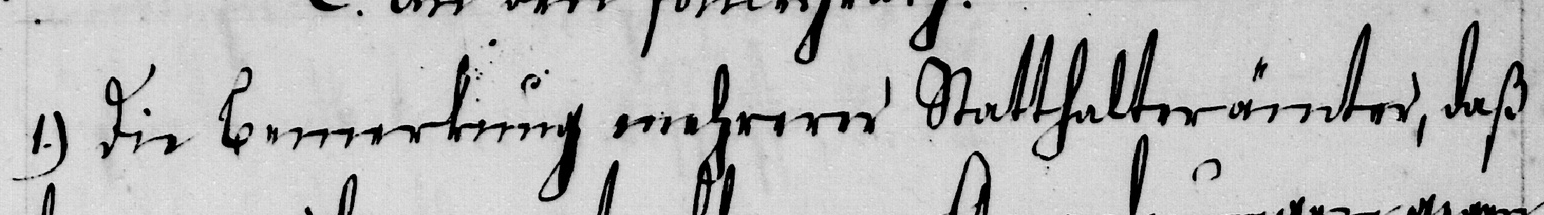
1.) Die Bemerkung mehrerer Statthalterämter, daß
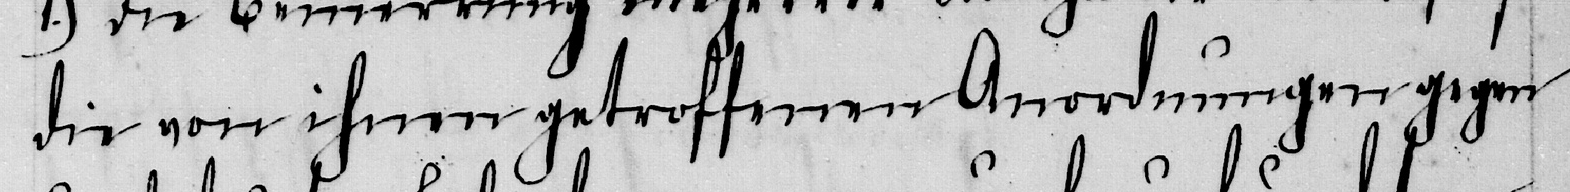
die von ihnen getroffenen Anordnungen gegen
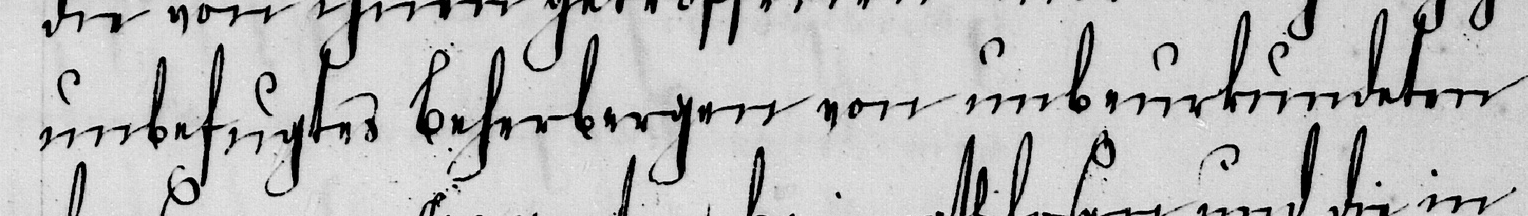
unbefugtes Beherbergen von unbeurkundeten
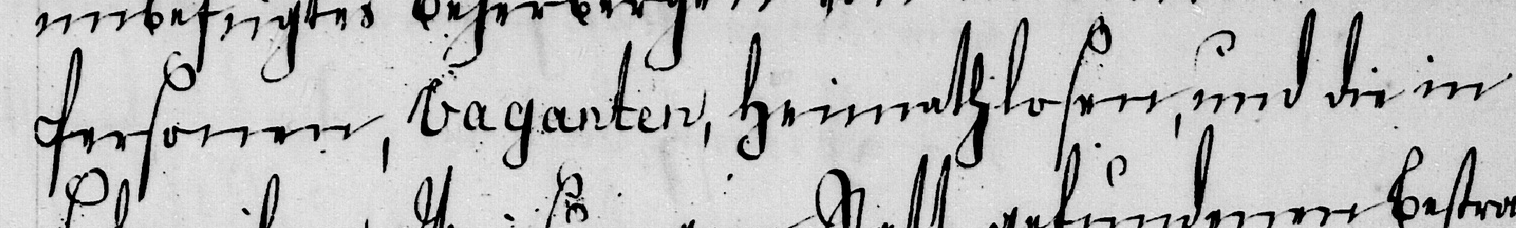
Personen, Vaganten, Heimathlosen, und die in
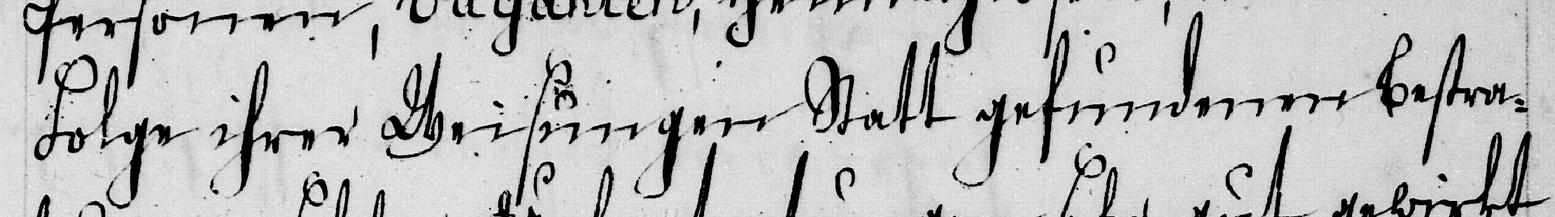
Folge ihrer Weisungen Statt gefundenen Bestra¬
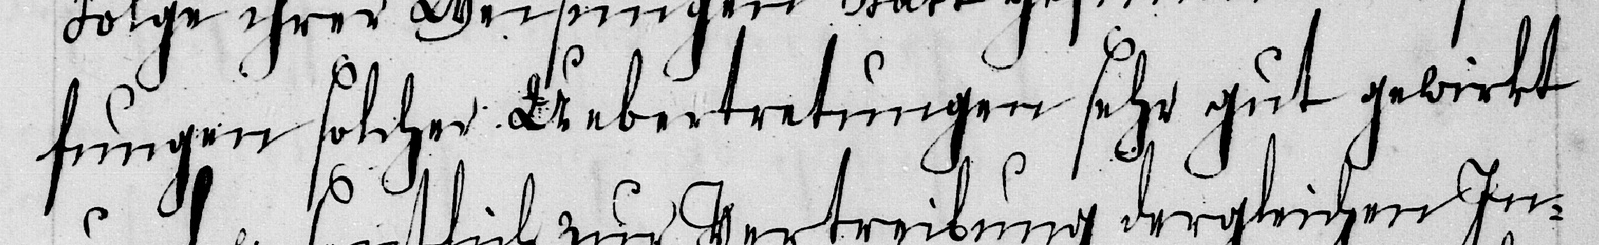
fungen solcher Uebertretungen sehr gut gewirkt
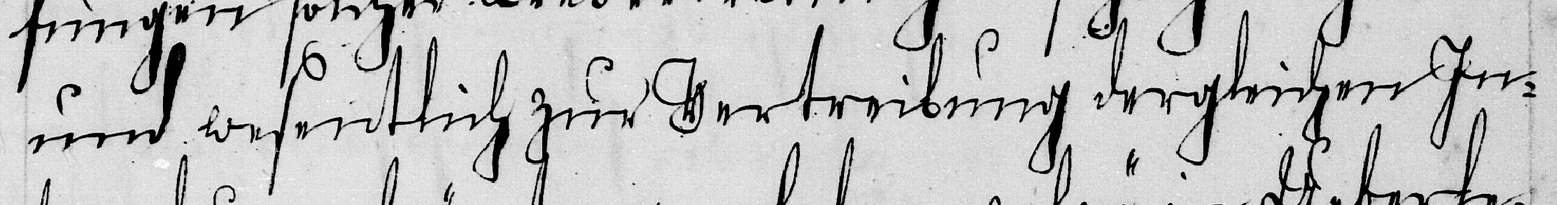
und wesentlich zur Vertreibung dergleichen In¬
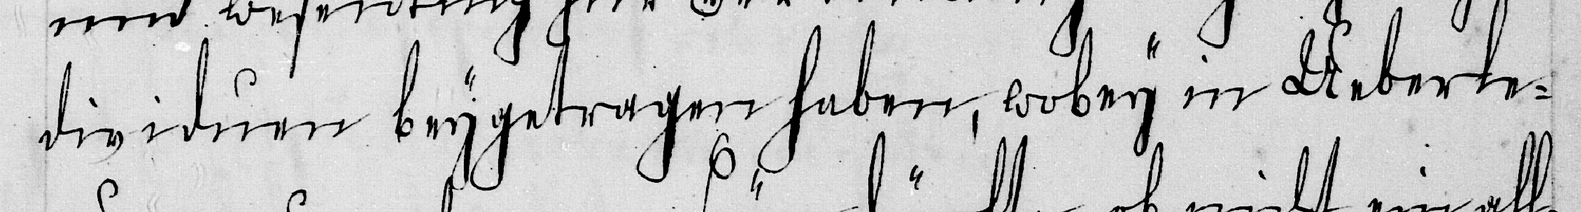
dividuen beygetragen haben, wobey in Ueberle¬
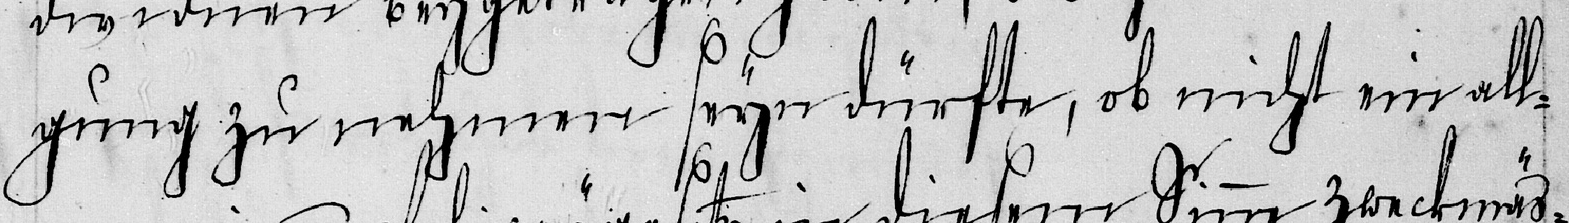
gung zu nehmen seyn dürfte, ob nicht ein all¬
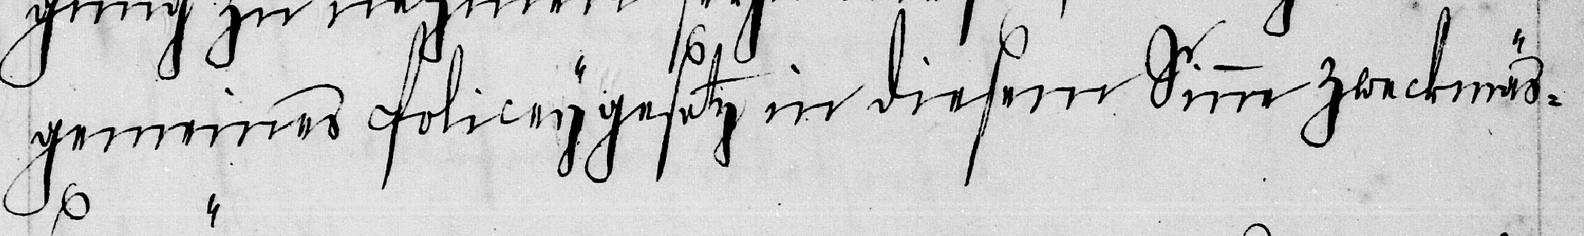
gemeines Policeygesetz in diesem Sinne zweckmäs¬
